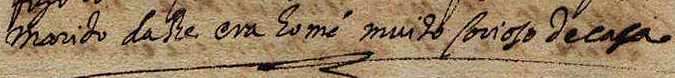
marido da Re era homē muito Corioso de casa
